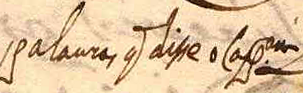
palauras q̄ disse o Cap̄.am
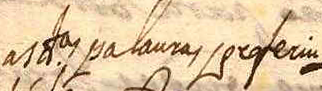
as d.as palauras proferiu
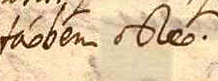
tãobem o Reo.
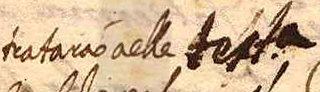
trataraõ a elle test.a
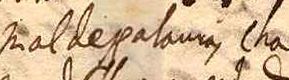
mal de palauras Cha
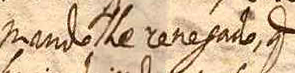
mando lhe renegado, q̄
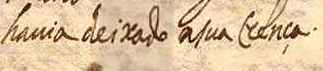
hauia deixado a sua Crença.
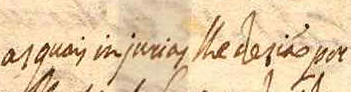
as quais injurias lhe dezião por
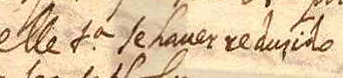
elle t.a se hauer reduzido
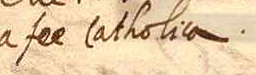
a fee Catholica.
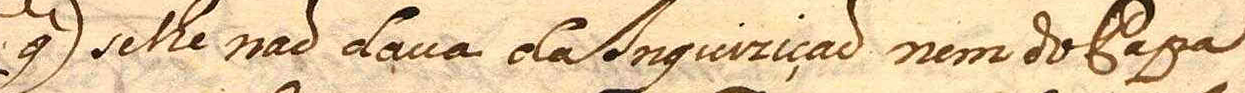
q̄ se lhe naõ daua da Inquiziçaõ nem do Papa
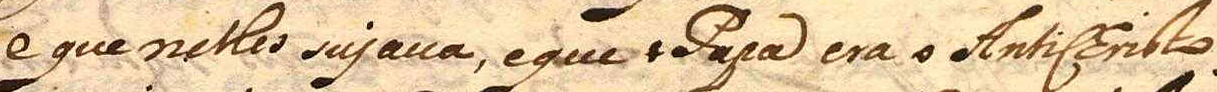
e que nelles sujaua, e que o Papa era o AntiChristo
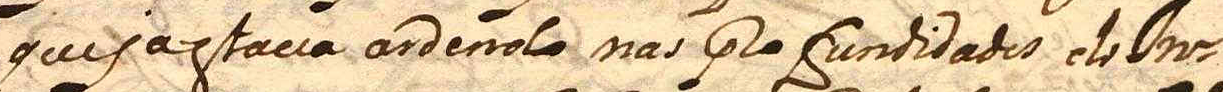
que ja estaua ardendo nas profundidades do In
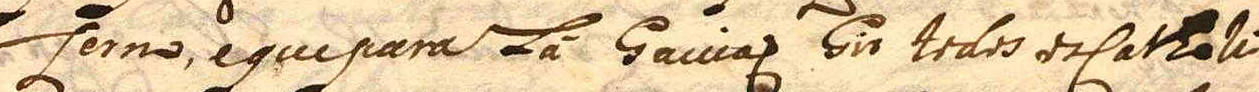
ferno, e que para Lá hauiaõ hir todos os Catholi
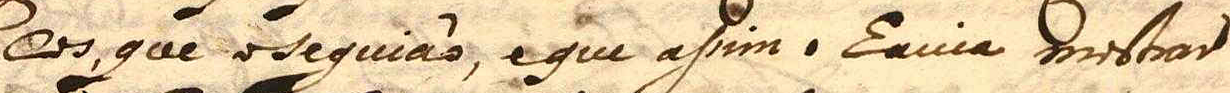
cos, que o seguiaõ, e que assim o hauia mostrar
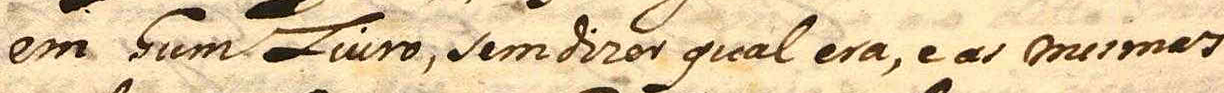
em hum Liuro, sem dizer qual era, e as mesmas
